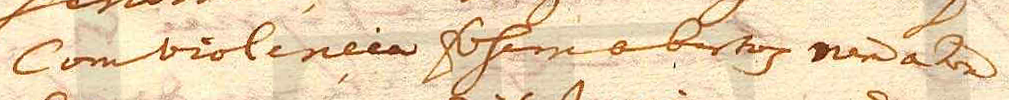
Com violencia fosem abertos nem aRom
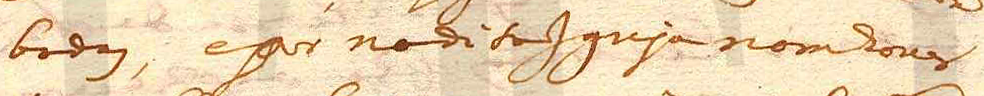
badas e por na dita Jgreja nam hauer
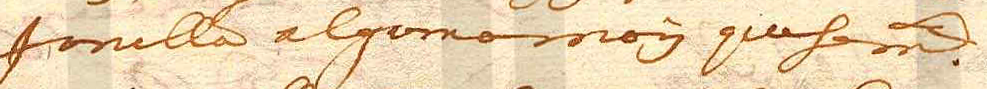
Janella alguma mais que som.te
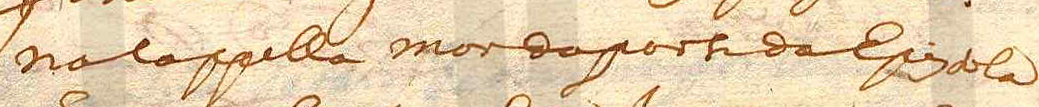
na cappella mor da parte da Epistola
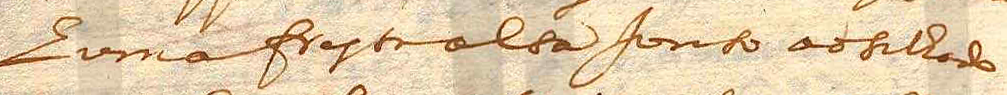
huma fresta alta Junto ao telhado
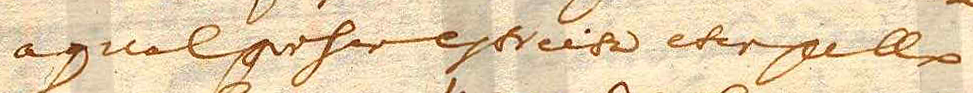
a qual por ser estreita e ter pello
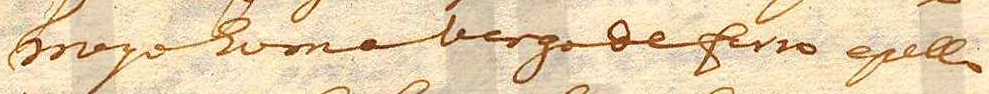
meyo huma verga de ferro e pello
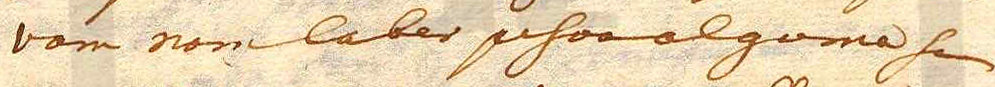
vam nam Caber pesoa alguma se
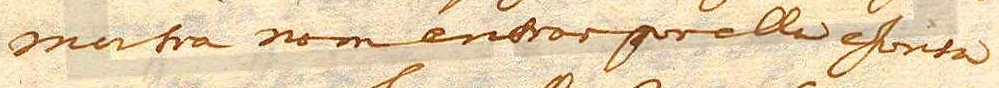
mostra nam entrar por ella e Junta
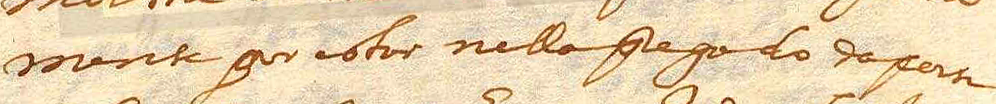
mente por estar nella pregado da parte
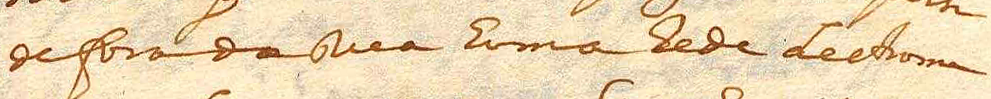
de fora da Rua huma Rede de Arame
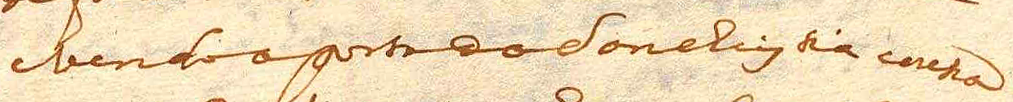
e vendo a porta da Sanchristia e outra
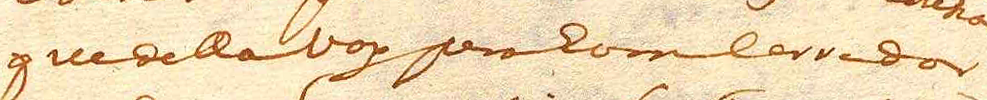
que della vay pera hum corredor
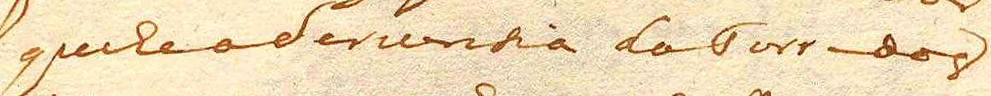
que he a Seruentia da Torre dos
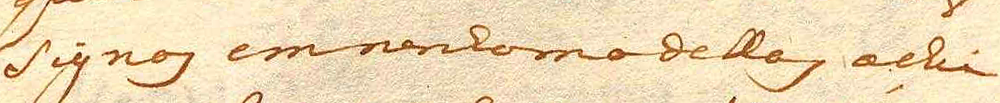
signos em nenhuma dellas achei
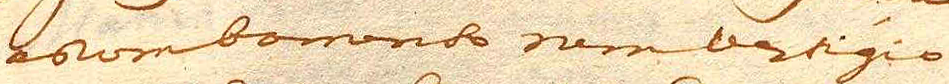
aRombamento nem vestigio
